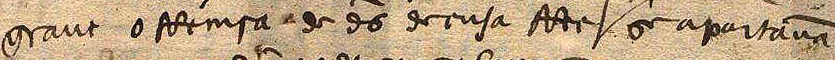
graue offemsa de ds̄ de cuja ffee se apartauā
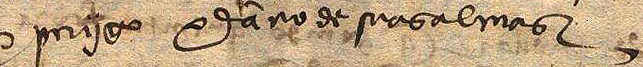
e perijgo e dāno de suas almas /
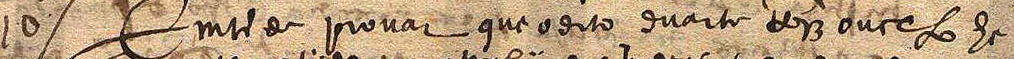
10o / Emtēde prouar que o dito duarte R̄ojz o uelho he
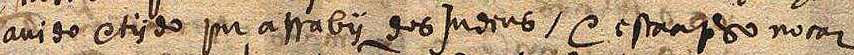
auido e tijdo por arrabij dos Judeus / e estaa p̄so no car
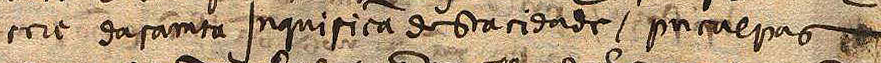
cere da samta Jnquisiçā desta cidade / por culpas
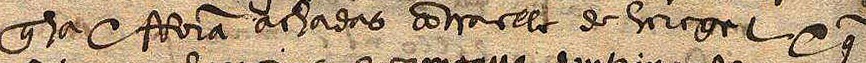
q̄ ha e fforā achadas c̄otra elle de herege / e q̄
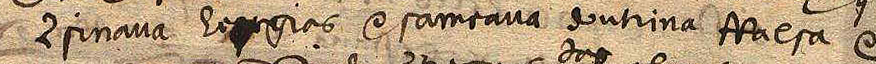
ēsinaua he_egias e sameaua doutrina ffalsa e
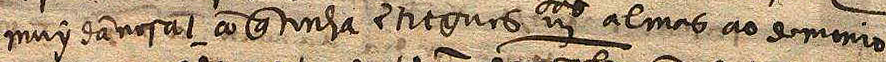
muy dānosa / c̄o q̄ tinha ētregues mtas almas ao demonio
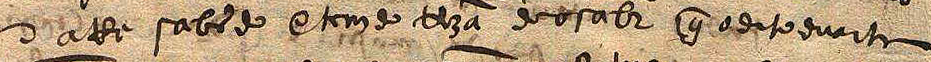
e a Re sabēdo e temdo Rezā de o s̄abr q̄ o dito duarte
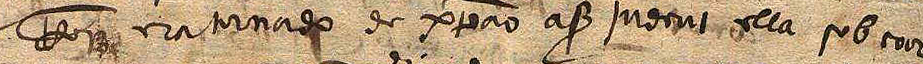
R̄ojz era tornado de xpão a ꞩ judeu / ella sob coor
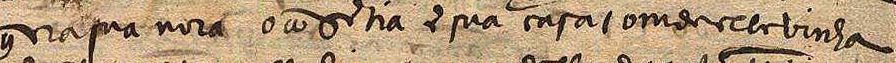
q̄ era sua nora o c̄osētia ē sua casa / omde elle vinha
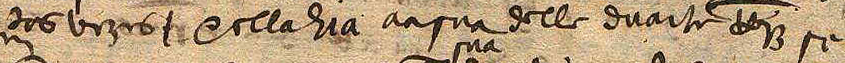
mtas vezes / e ella hia aa sua delle duarte R̄ojz se
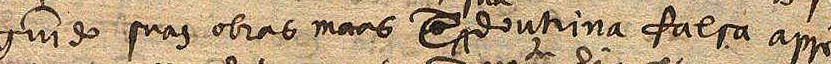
guīdo suas obras maas e sua doutrina falsa aprē
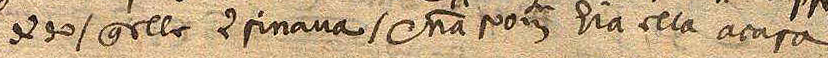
dēdo / q̄ elle ēsinaua / e nã soomte hia ella a casa
